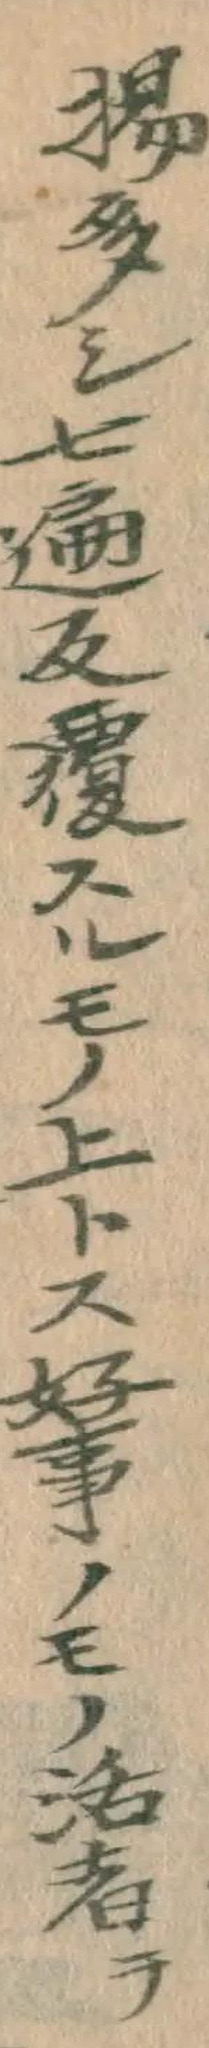揚多シ七遍反覆スルモノ上トス好事ノモノ活者ヲ
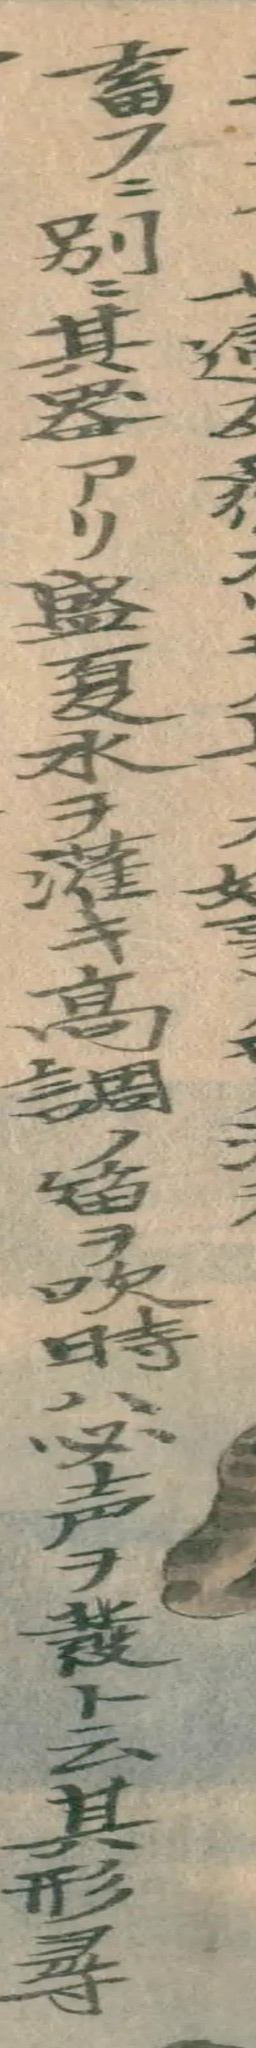畜フニ別ニ其器アリ盛夏水ヲ灌キ高調ノ笛ヲ吹時ハ必声ヲ發ト云其形尋
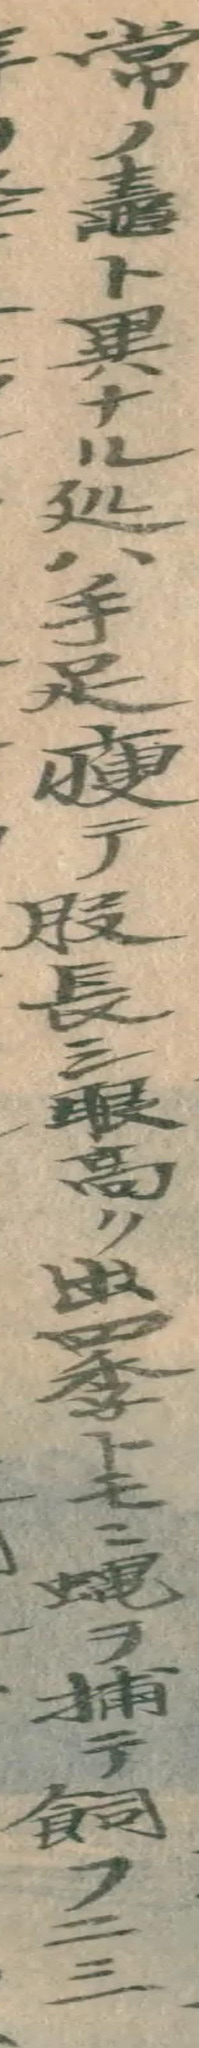常ノ鼃ト異ナル処ハ手足痩テ股長シ眼高ク出四季トモニ蝿ヲ捕テ飼フ二三
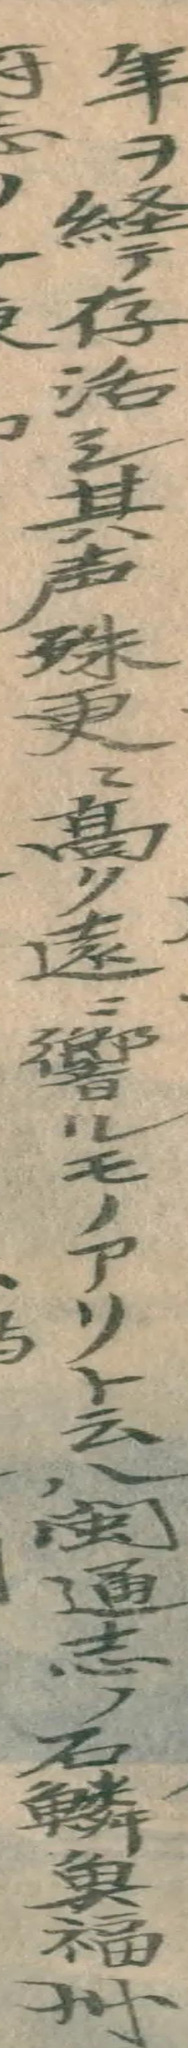年ヲ経テ存活シ其声殊更ニ高ク遠ニ響ルモノアリト云ハ閩通志ノ石鱗魚福州
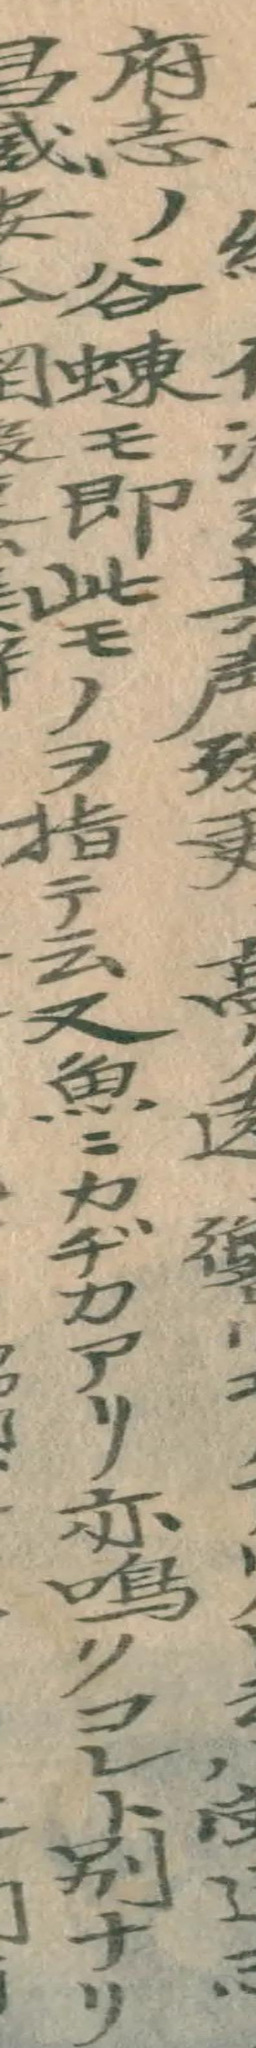府志ノ谷蝀モ即此モノヲ指テ云又魚ニカヂカアリ亦鳴クコレト別ナリ
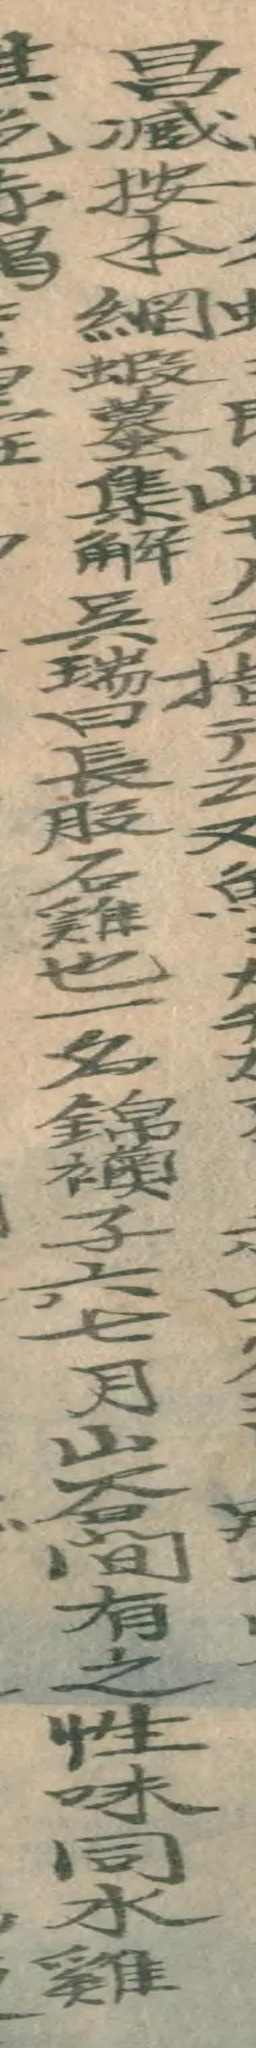昌臧按本綱蝦蟇集解呉瑞曰長股石𨿸也一名錦襖子六七月山谷間有之性味同水𨿸
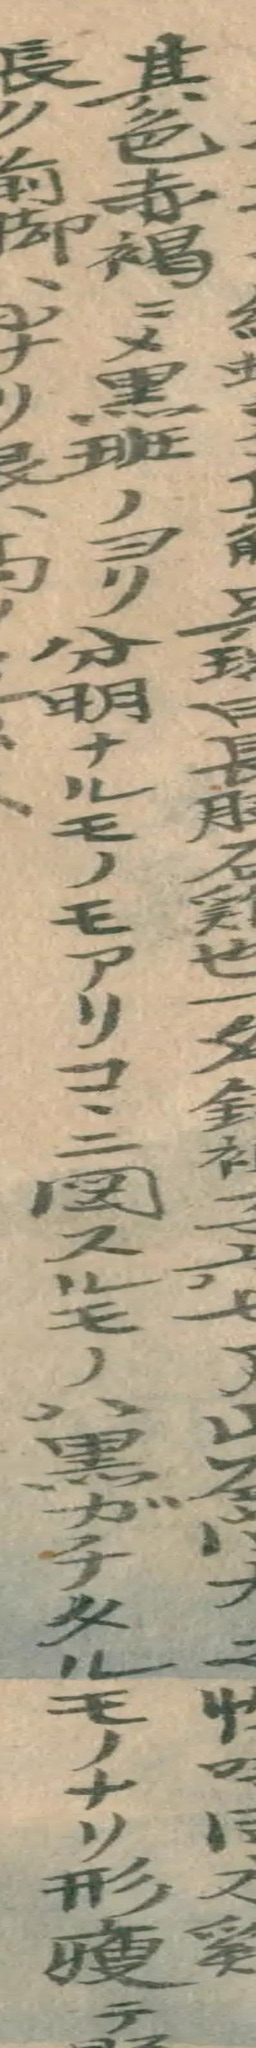其色赤褐ニシテ黒班ノヨリ分明ナルモノモアリコヽニ図スルモノハ黒ガチタルモノナリ形痩テ股
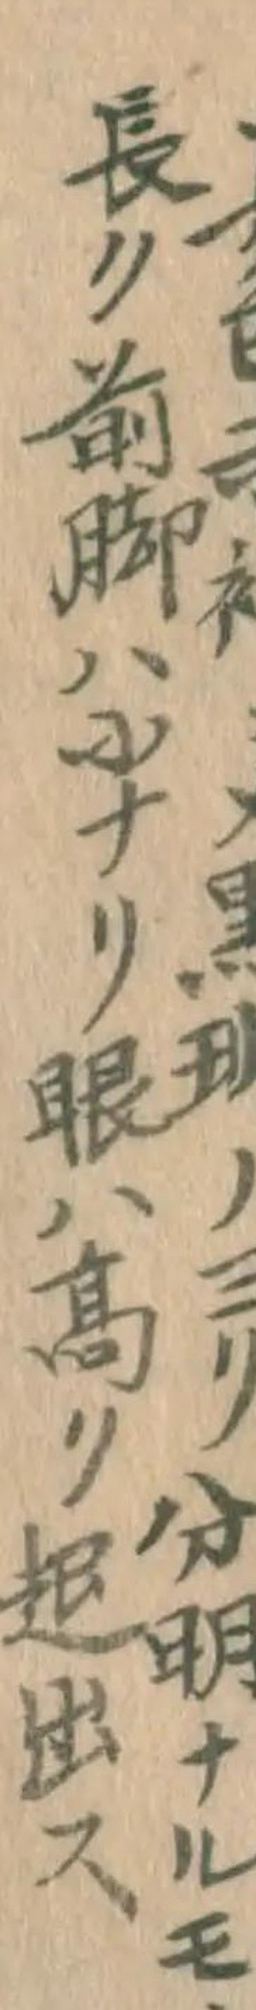長ク前脚ハ小ナリ眼ハ高ク起出ス

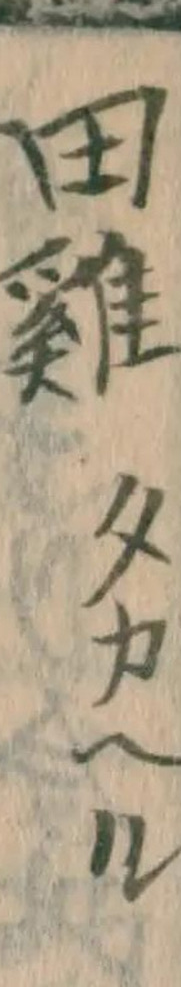田𨿸タガヘル
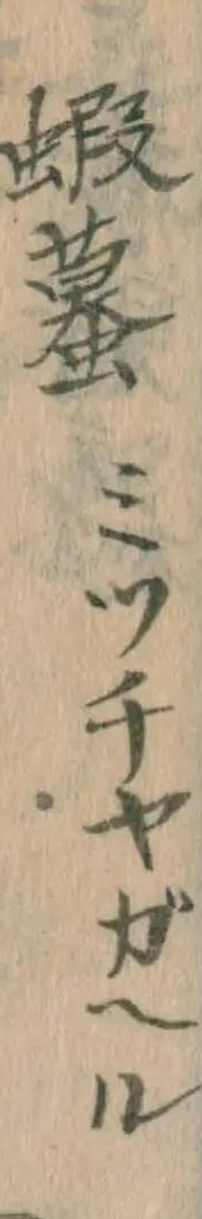蝦蟇ミツチヤガヘル
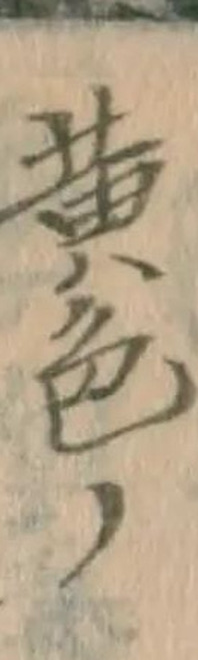黄色ノ
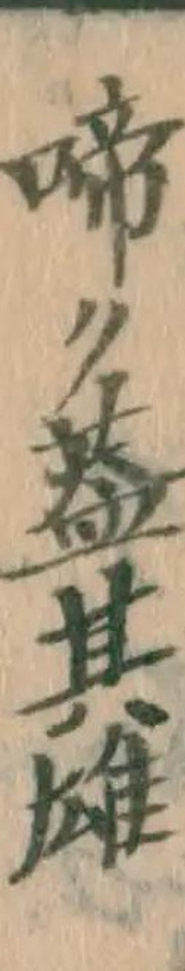啼ク葢其雄

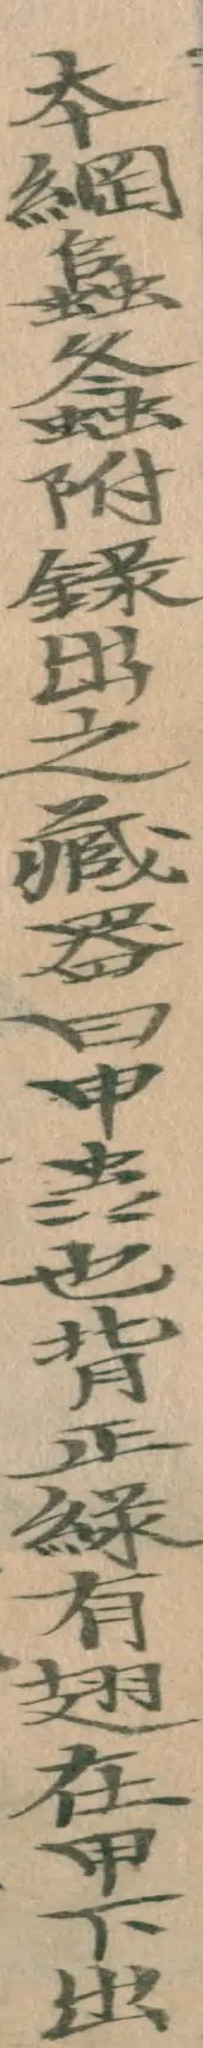吉丁蟲本綱𧒂螽附録出之藏器曰申蟲也背正緑有翅在甲下出
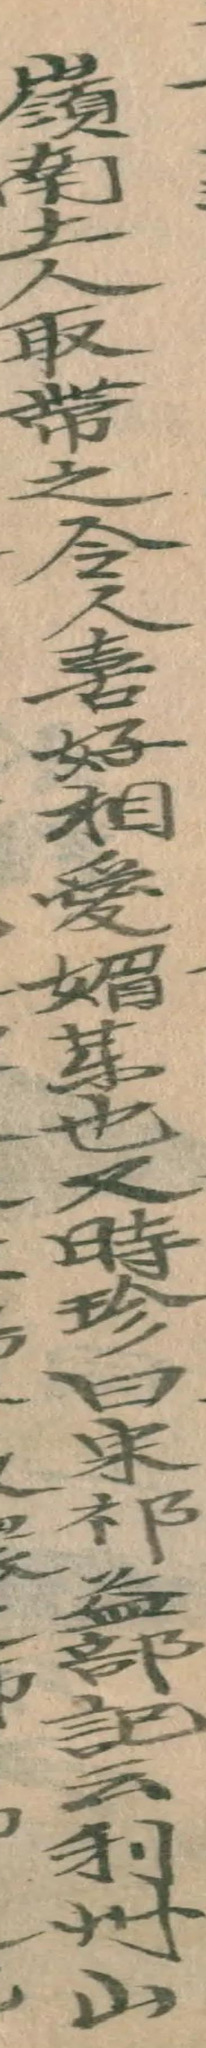嶺南土人取帯之令人喜好相愛媚薬也又時珍曰宋祁益部記云利州山
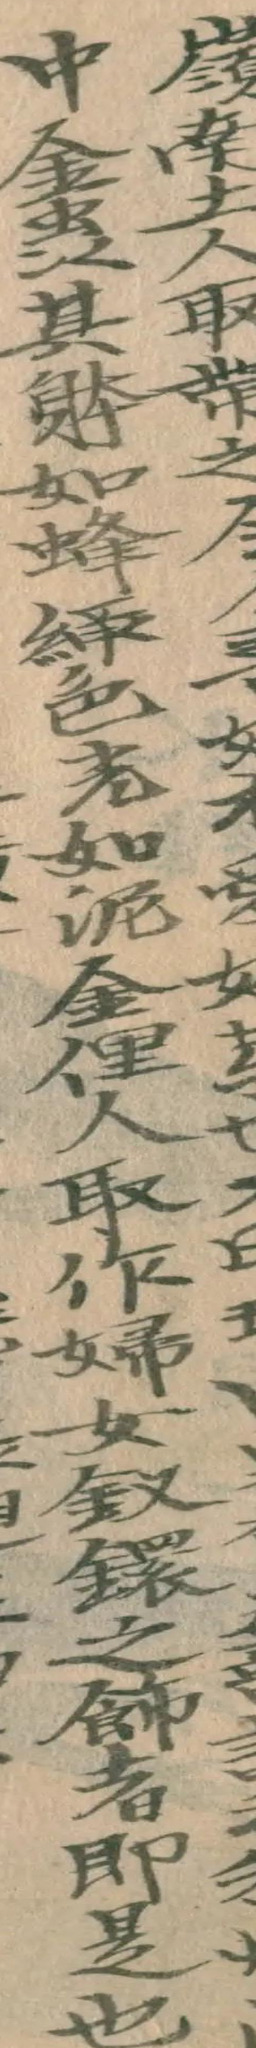中金蟲其躰如蜂緑色光如泥金俚人取作婦女釵鐶之飾者即是也
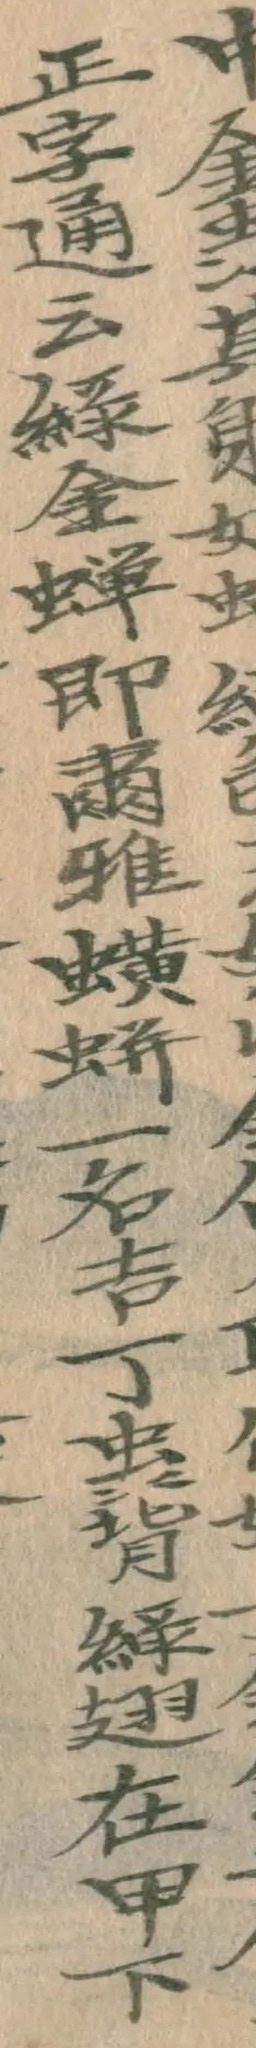正字通云緑金蝉即爾雅蟥蛢一名吉丁蟲背緑翅在甲下
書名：千蟲譜 3巻. [1]
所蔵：国立国会図書館 National Diet Library, JAPAN
